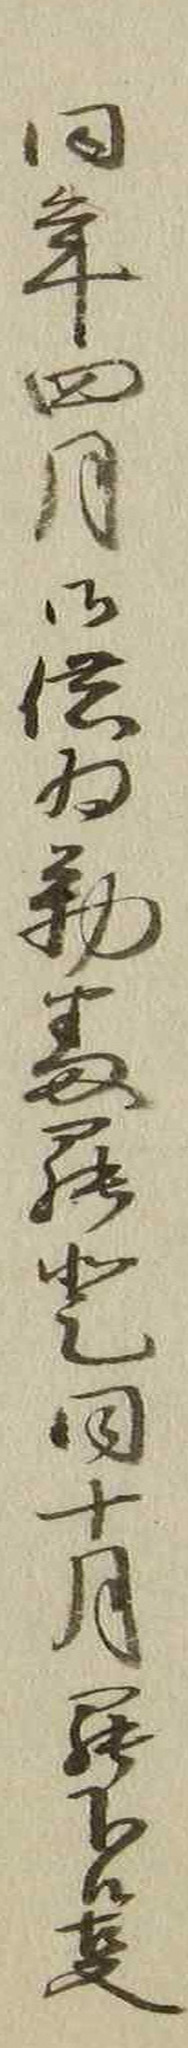一同年四月御供為勤番罷登同十月罷下候事
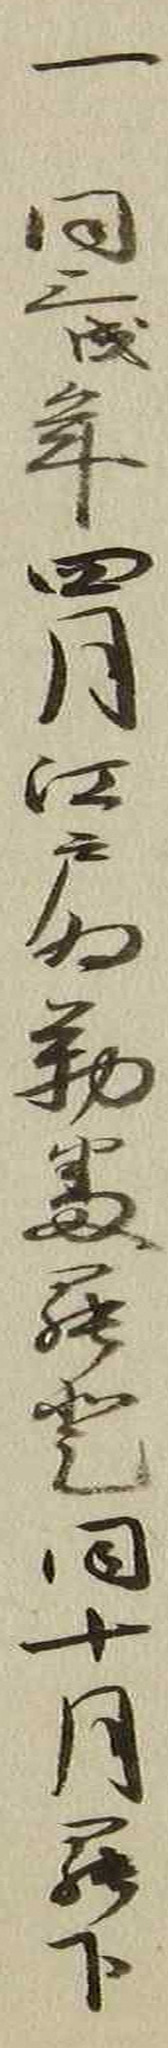一同三戌年四月江戸為勤番罷登同十月罷下
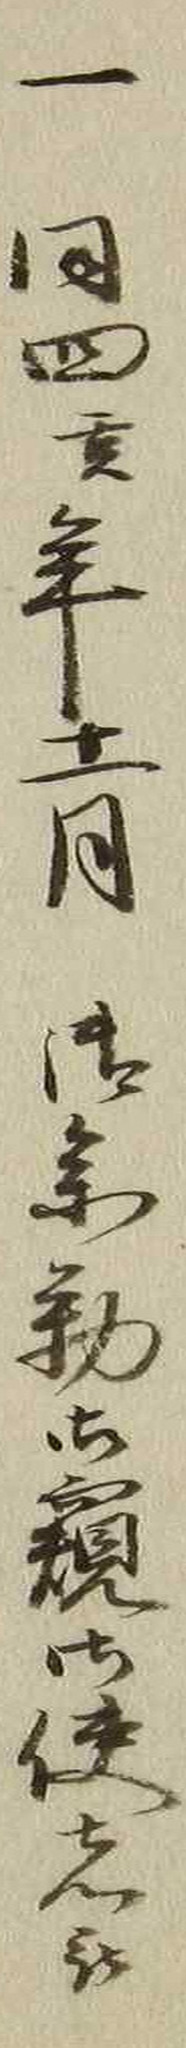一同四亥年十一月御参勤御窺御使者被
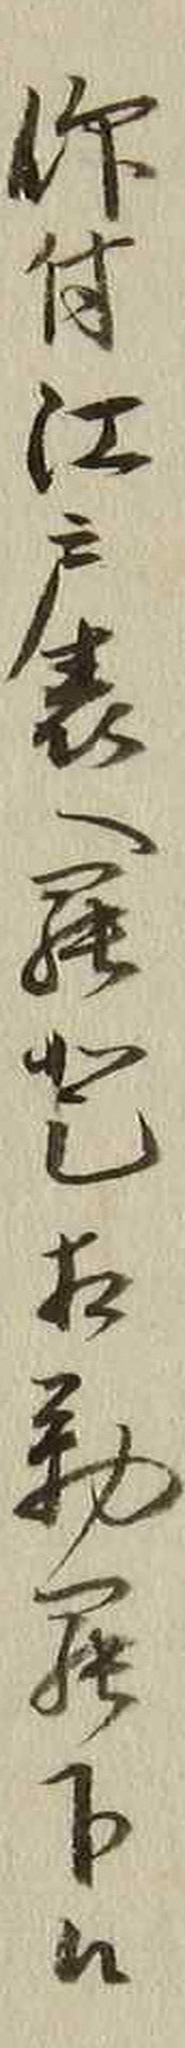仰付江戸表へ罷登相勤罷下候
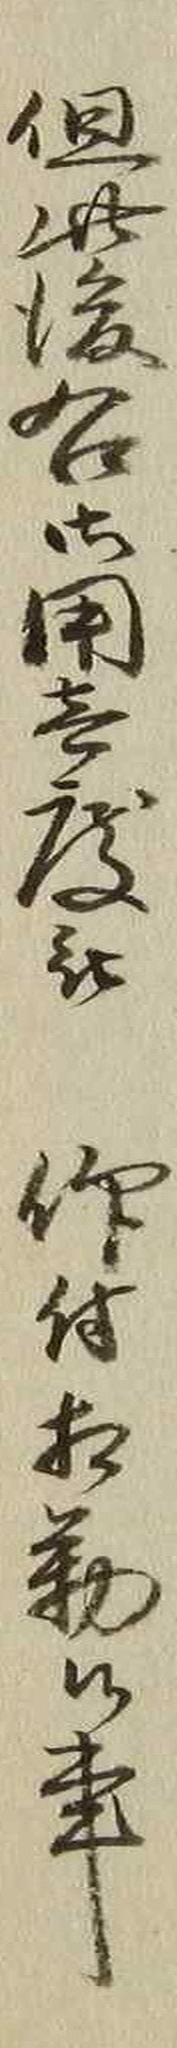但此後右御用壱度被仰付相勤候事
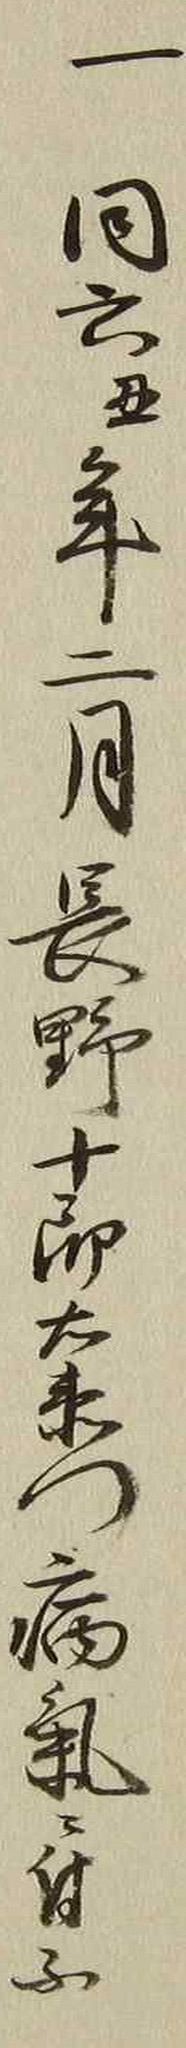一同六丑年二月長野十郎右衛門病気に付不
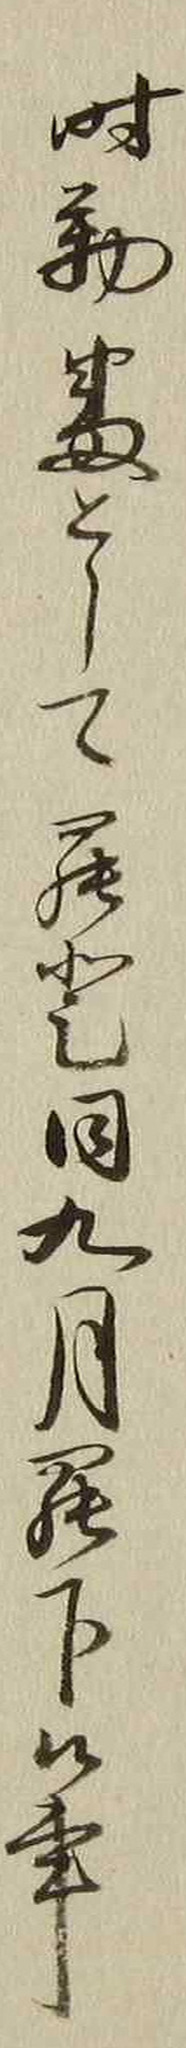時勤番として罷登同九月罷下候事
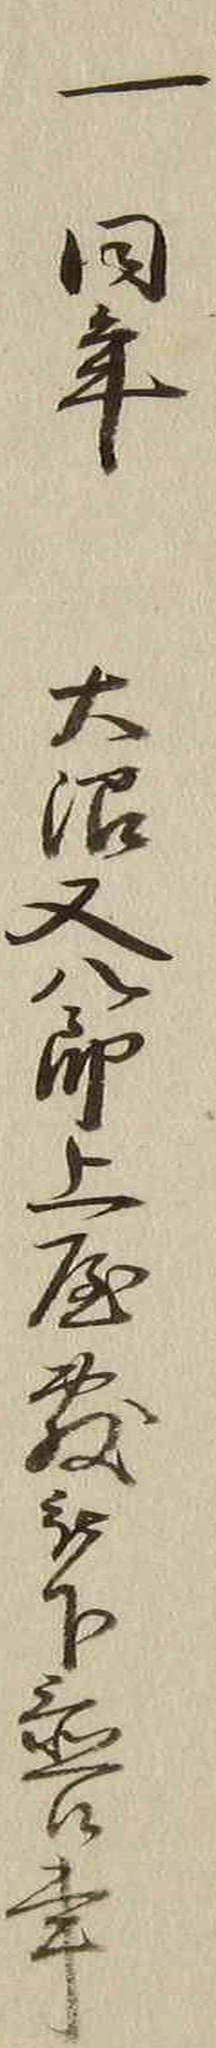一同年大沼又八郎上屋敷被下置候事
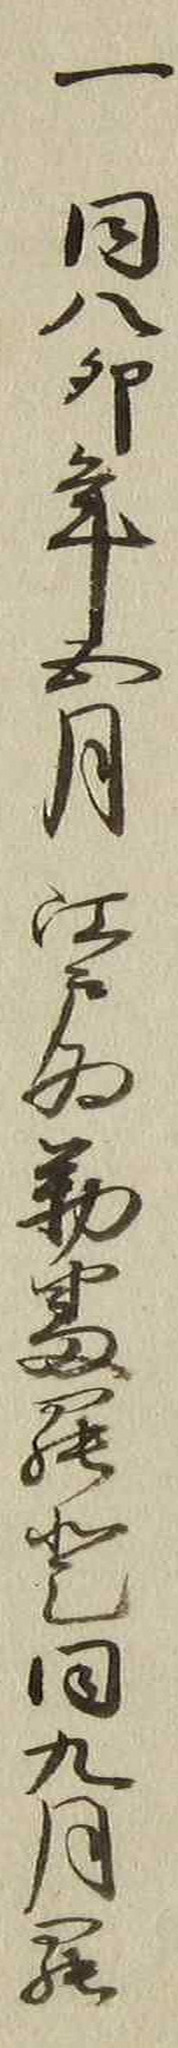一同八卯年五月江戸為勤番罷登同九月罷
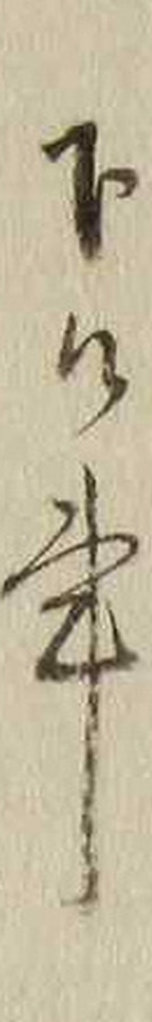下候事
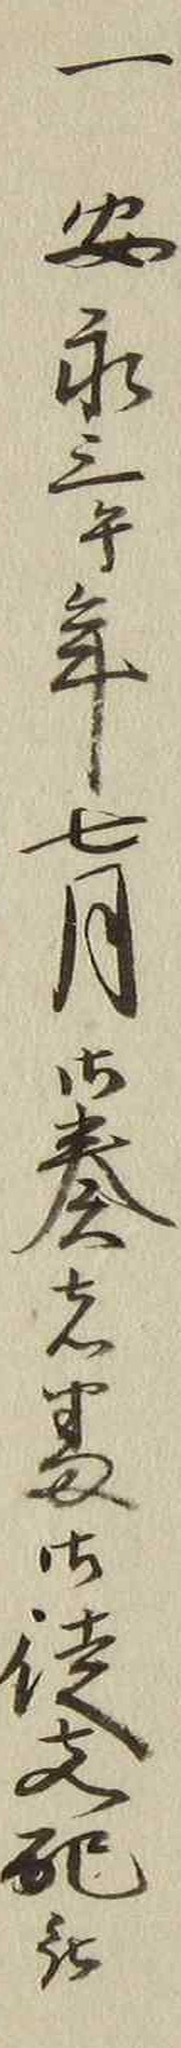一安永三午年七月御奏者番御徒支配被
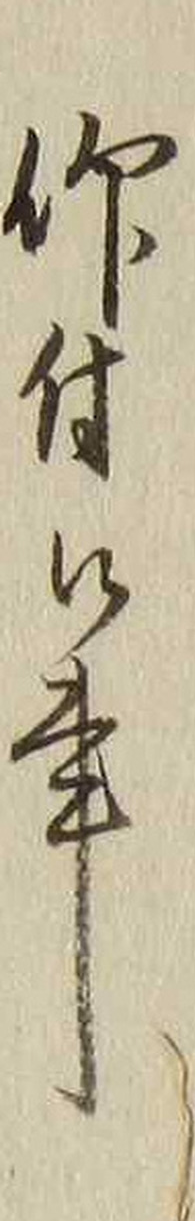仰付候事
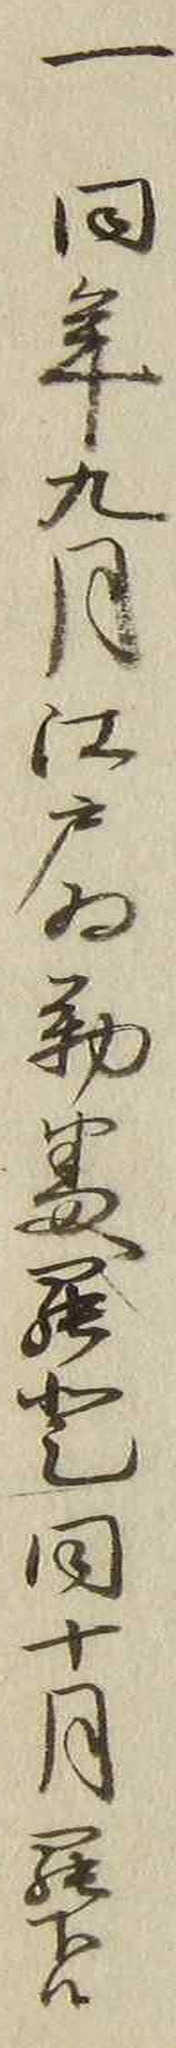一同年九月江戸為勤番罷登同十月罷下候
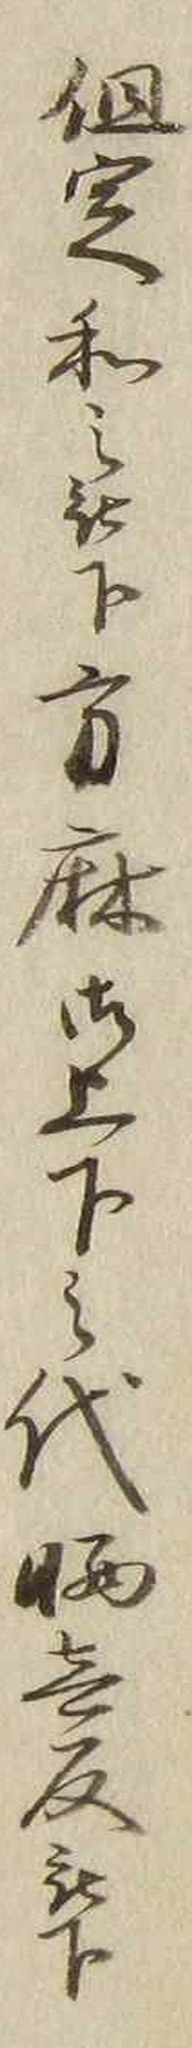但定和之被下方麻御上下之代晒壱反被下
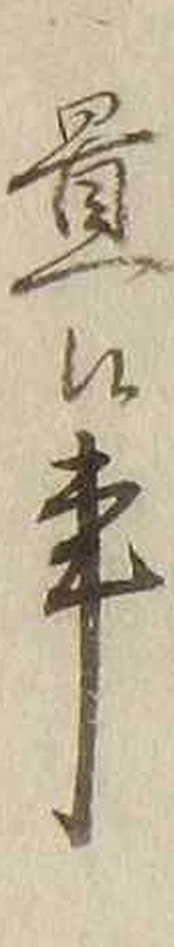置候事

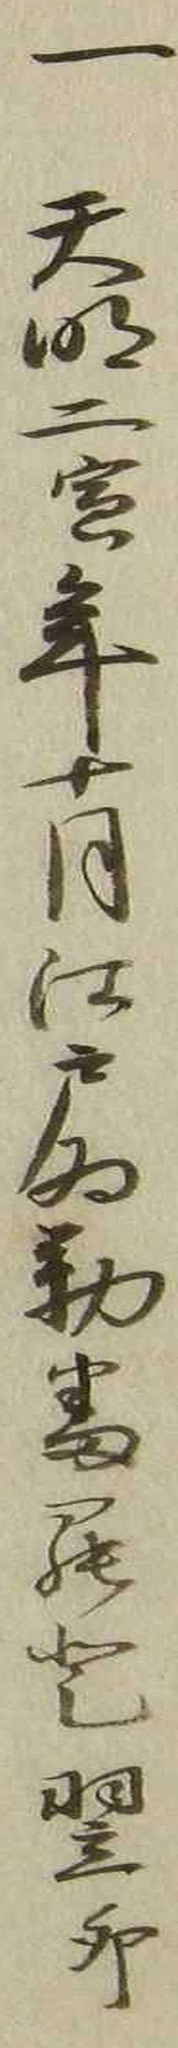一天明二寅年十月江戸為勤番罷登翌卯
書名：諸士系譜　巻之133　た之部9
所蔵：会津若松市立会津図書館
